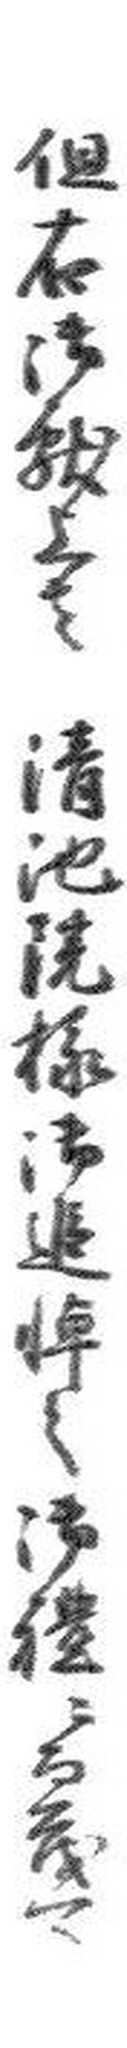但右御献上者清池院様御追悼之御礼ニ而も可
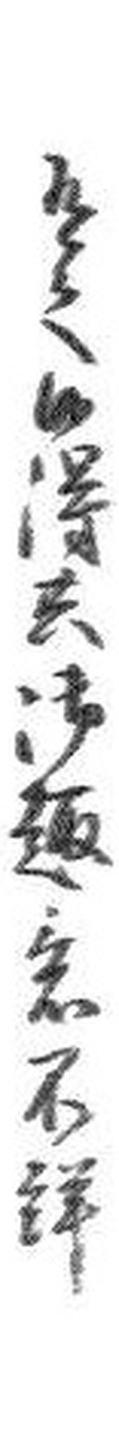有之候得共御趣意不詳
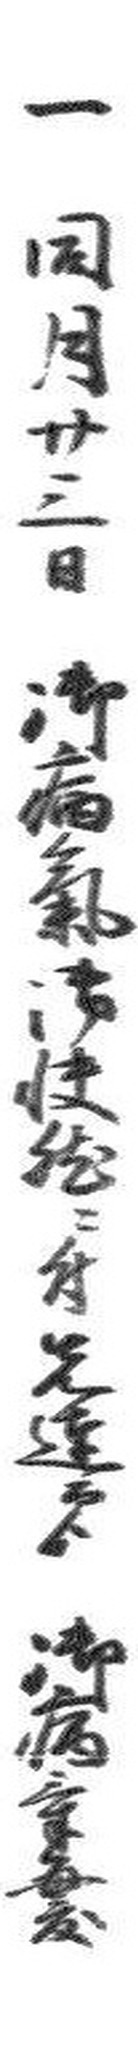一同月廿三日御病気御快然ニ付先達而ゟ御病気毎度
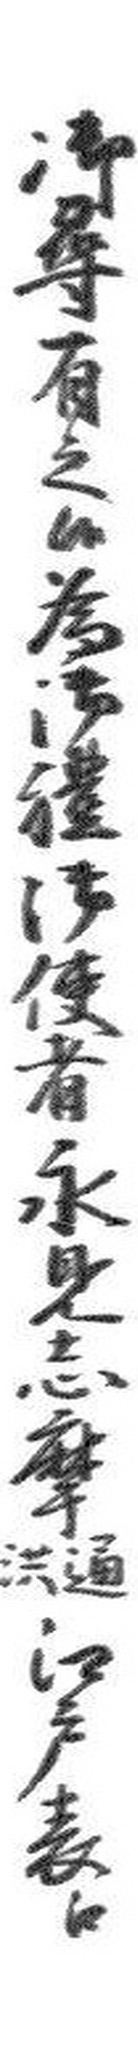御尋有之候為御礼御使者永見志摩通洪江戸表江

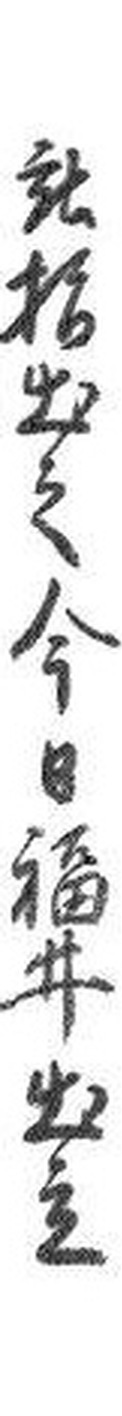被指出之今日福井出立
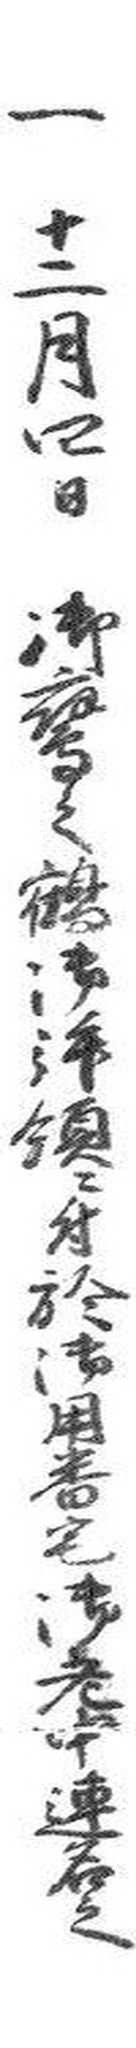一十二月四日御鷹之鶴御拝領ニ付於御用番宅御老中連名之
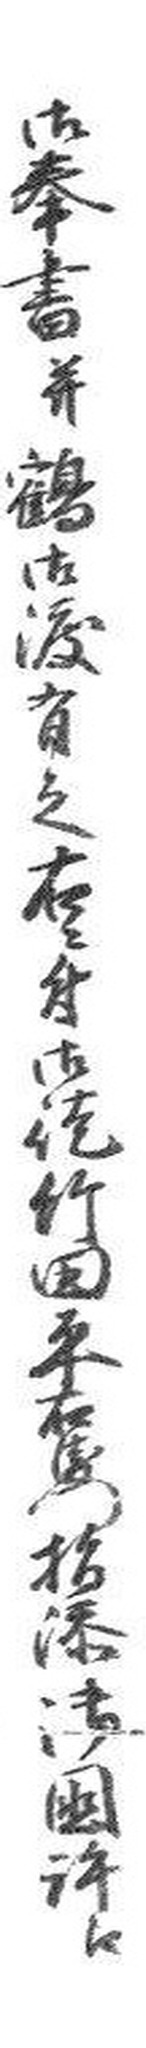御奉書幷鶴御渡有之右ニ付御徒竹田平右衛門指添御国許江
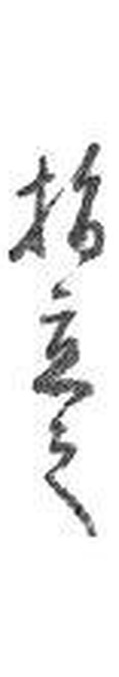指立之
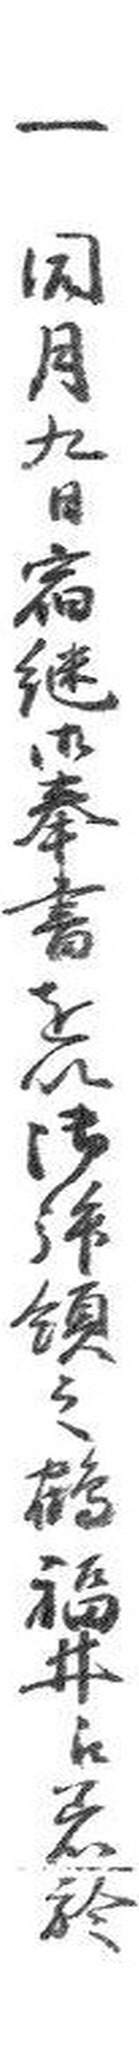一同月九日宿継御奉書を以御拝領之鶴福井江着於
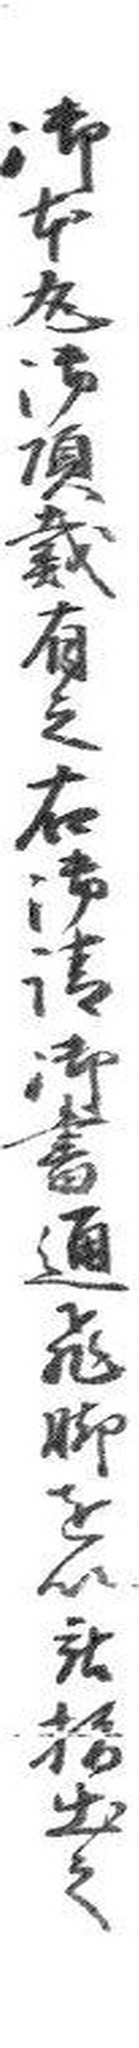御本丸御頂戴有之右御請御書通飛脚を以被指出之
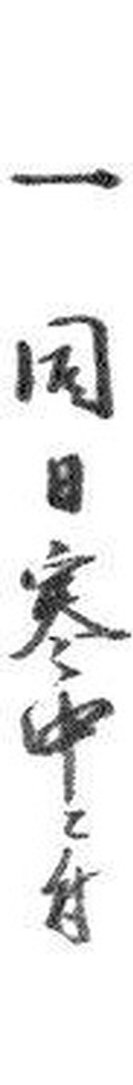一同日寒中ニ付
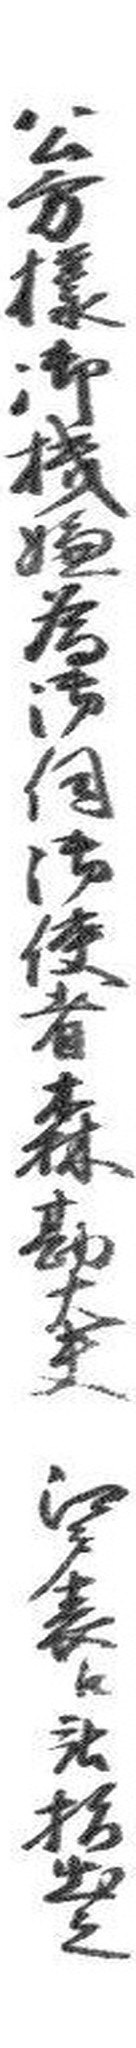公方様御機嫌為御伺御使者森勘太夫江戸表江被指出之
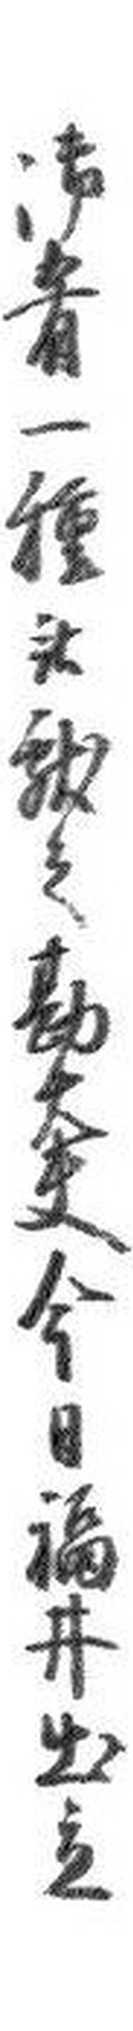御肴一種被献之勘太夫今日福井出立
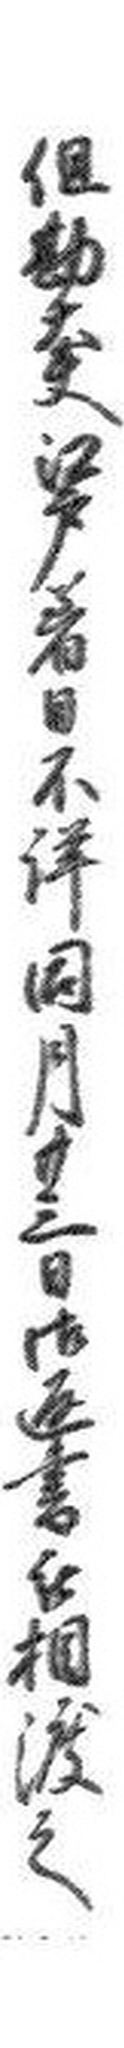但勘太夫江戸着日不詳同月廿三日御返書被相渡之
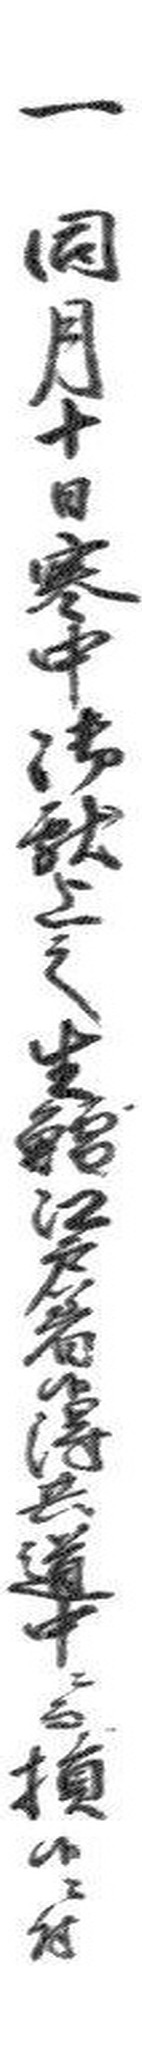一同月十日寒中御献上之生鱈江戸着候得共道中ニ而損候ニ付
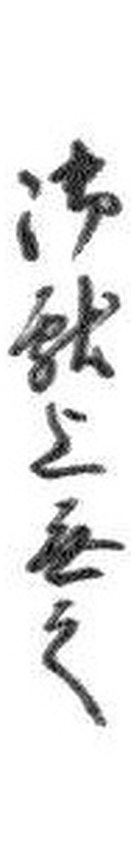御献上無之
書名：家譜 八 光通公 従寛文十年到同十二年
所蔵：福井県文書館 Fukui Prefectural Archives
